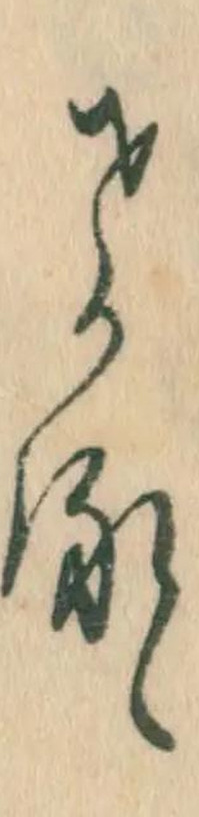せかるゝ
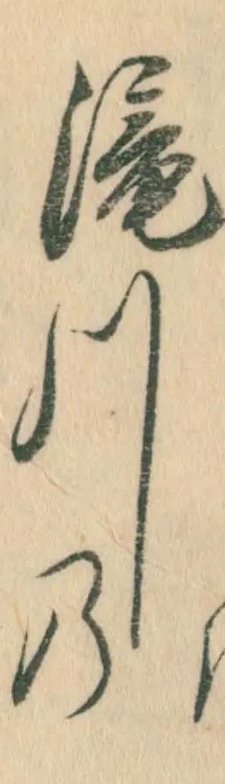滝川の
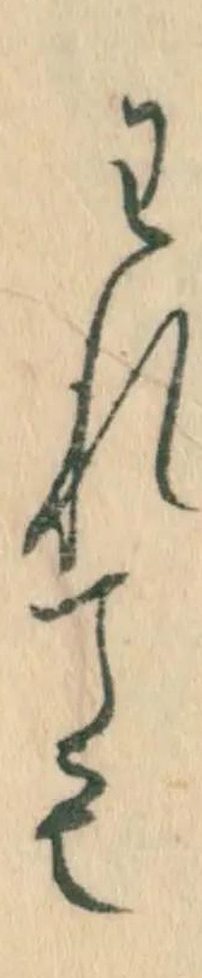われても
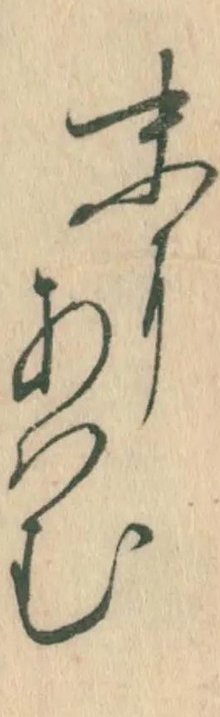あはむ

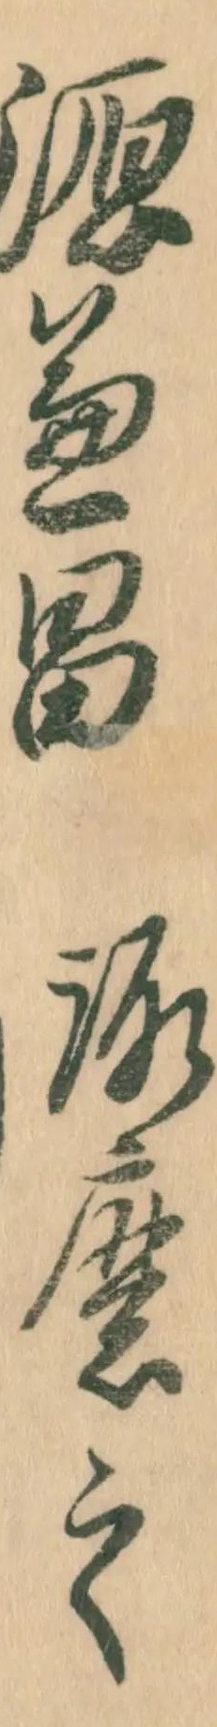源兼昌須磨之
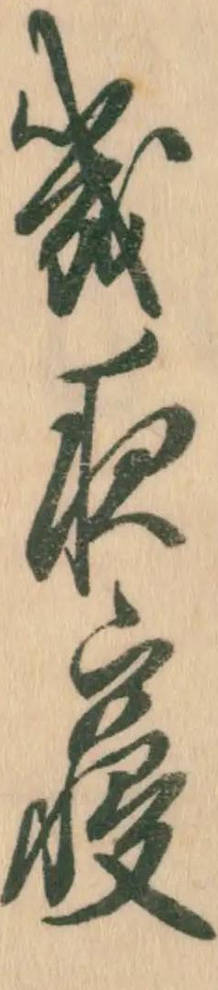幾夜寝
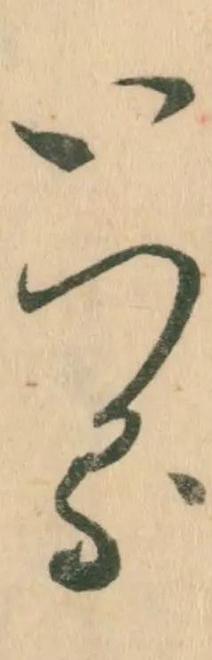いつる
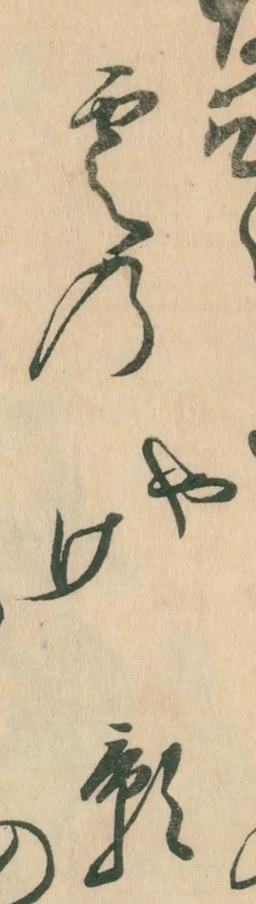雲のけ影
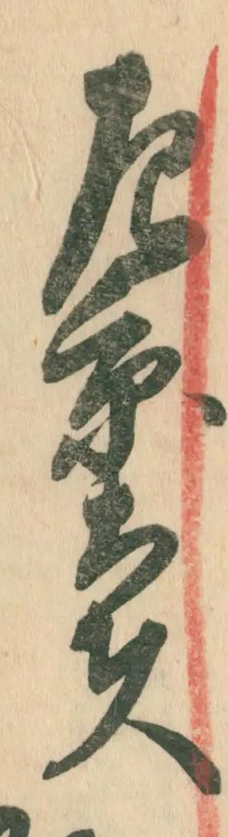左京大夫
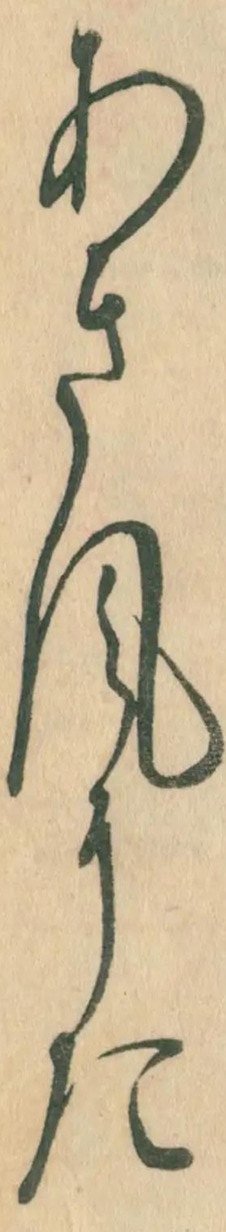あき風にた

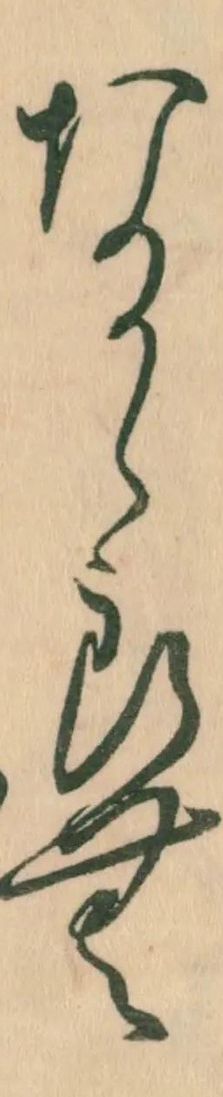なかゝらむ
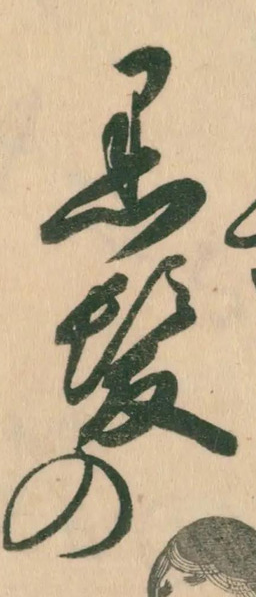黒髪の
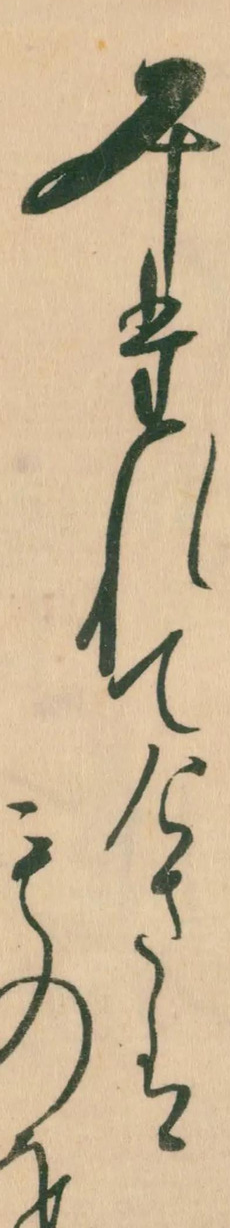みたれてけさは
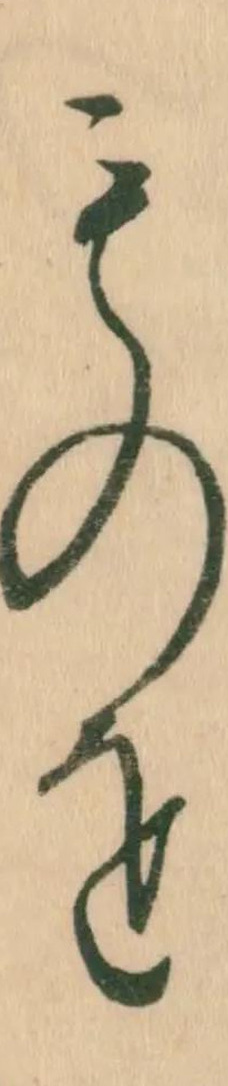ものを
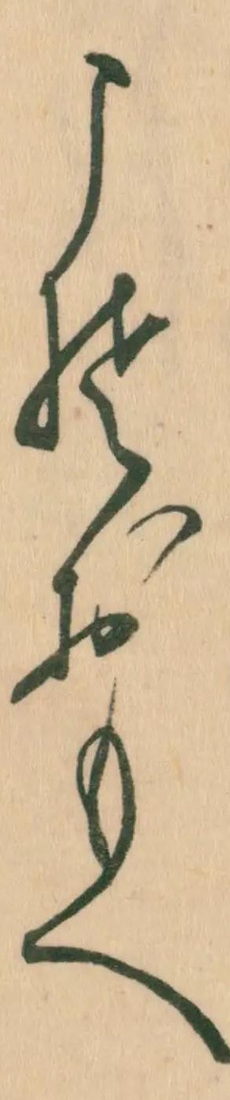こそおもへ
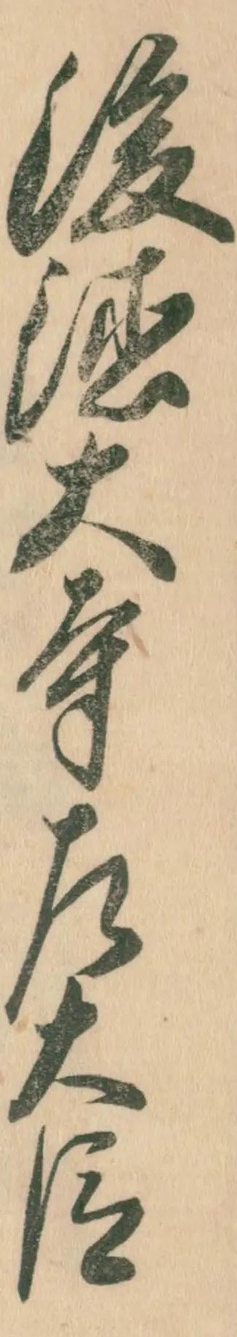後徳大寺左大臣
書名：錦百人一首あつま織
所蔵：国立国会図書館 National Diet Library, JAPAN
